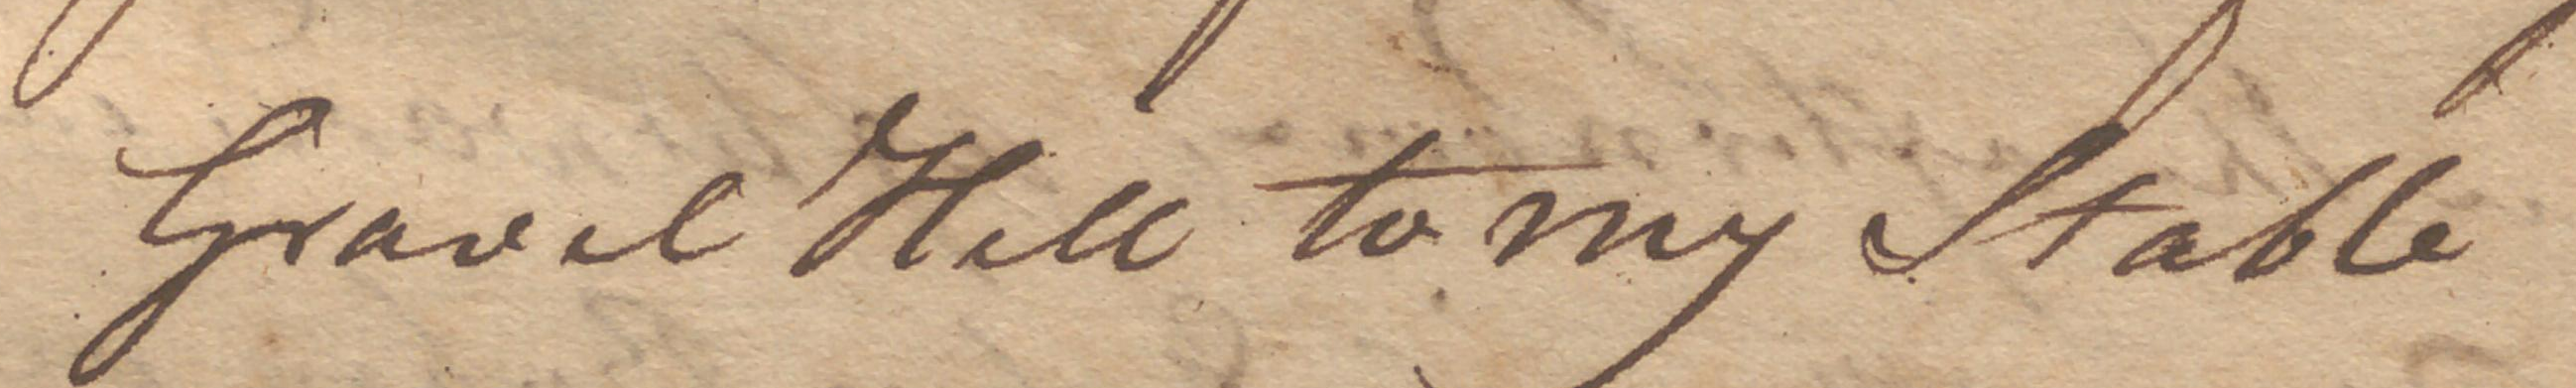Gravel Hill to my Stable
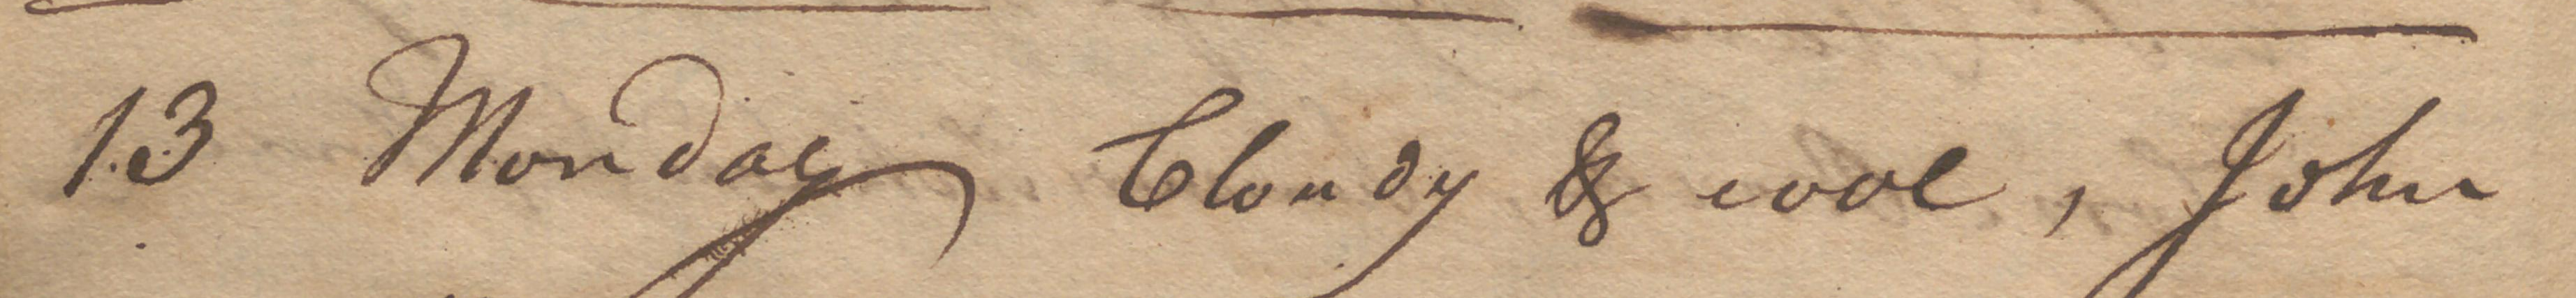13 Monday Cloudy & cool, John
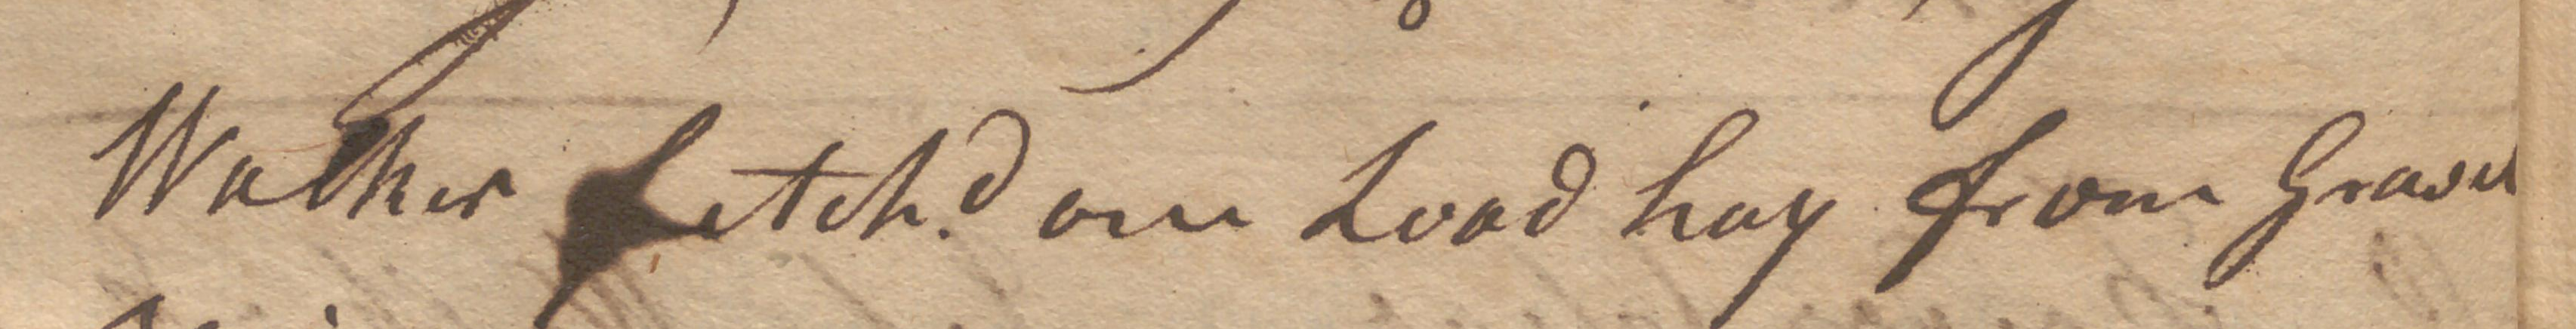Walker fetch^d. one Load hay from Gravel
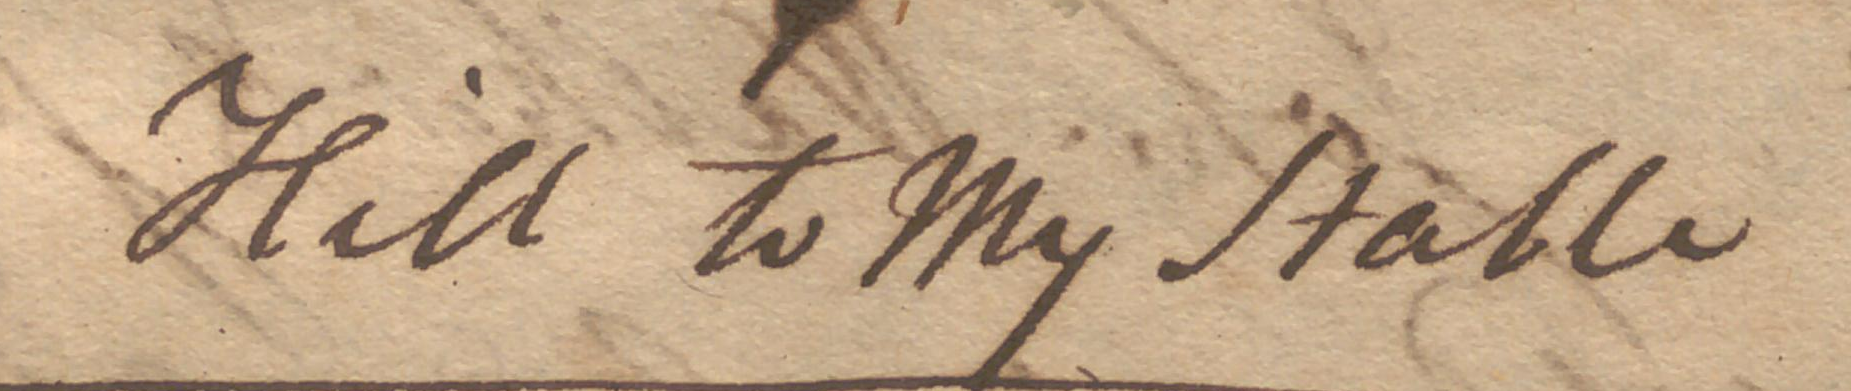Hill to My Stable
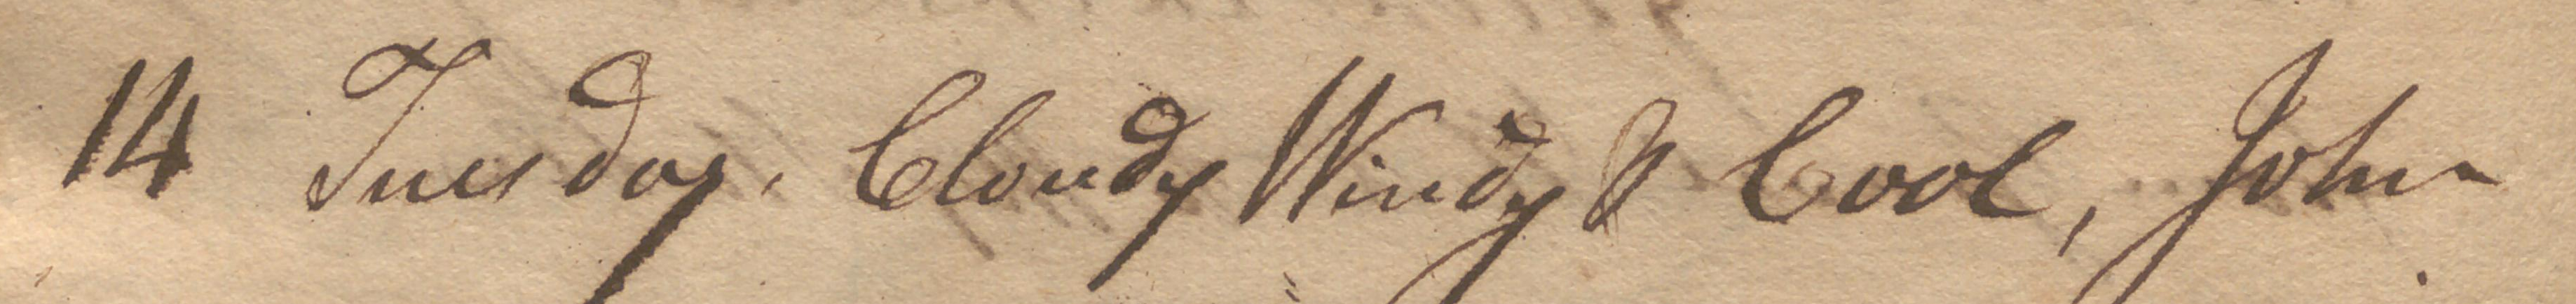14 Tuesday Cloudy Windy & Cool, John
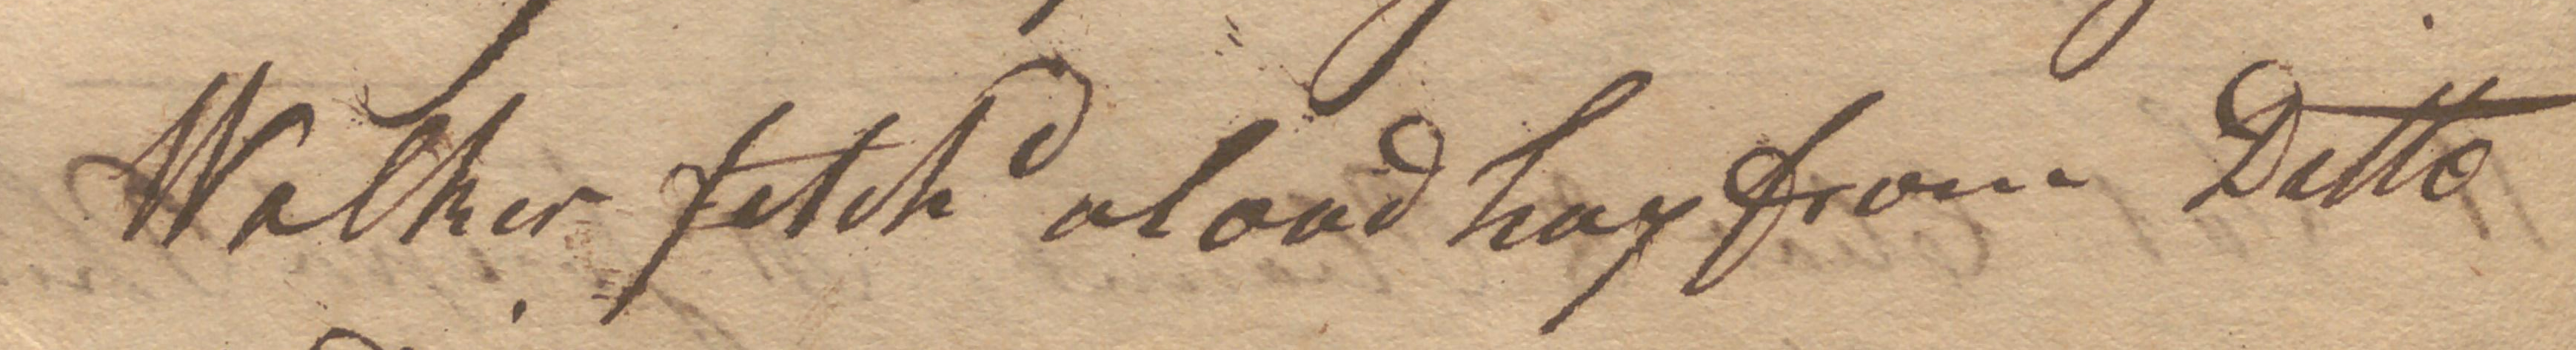Walker fetch^d a load hay from Ditto
